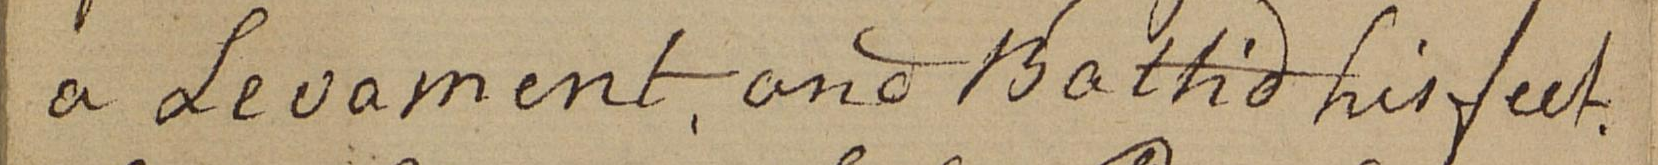a Levament, and Bath'd his feet.
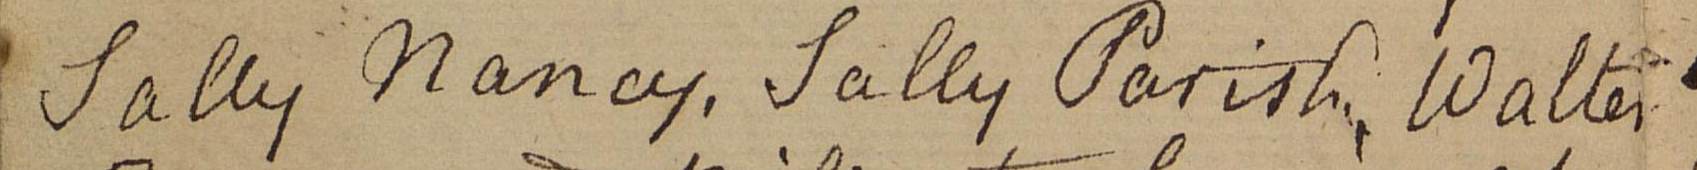Sally Nancy, Sally Parish, Walter
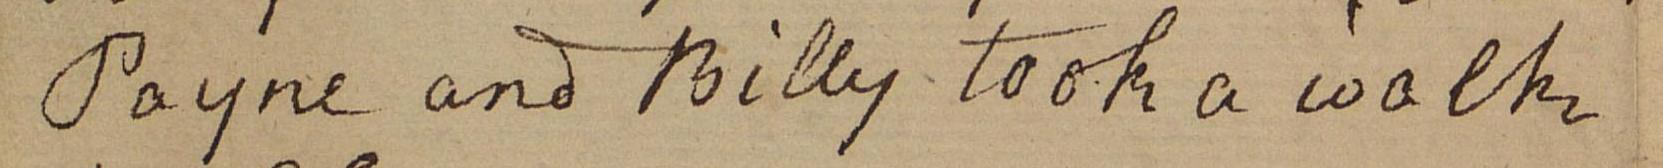Payne and Billy took a walk
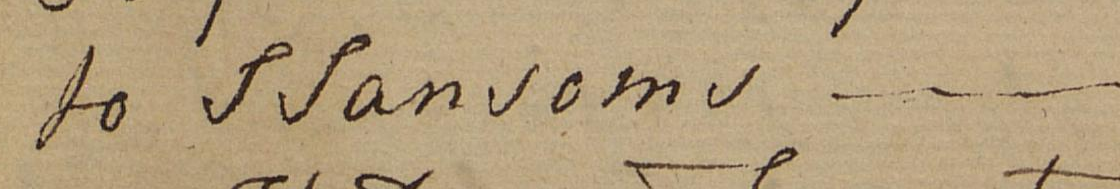to S Sansom's-
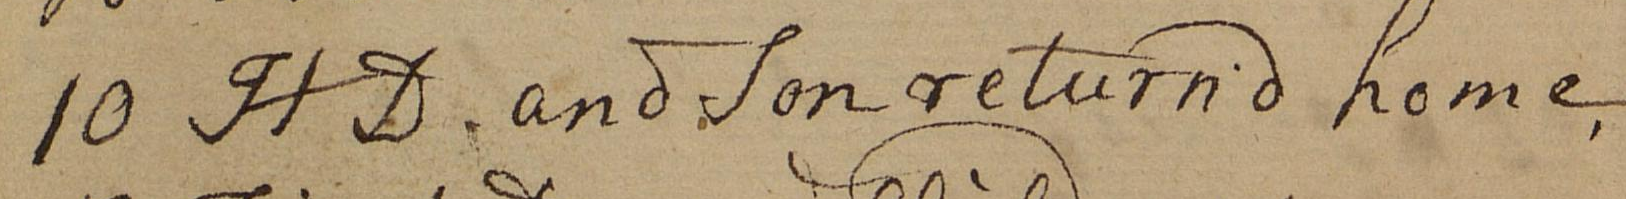10 HD. and Son return'd home
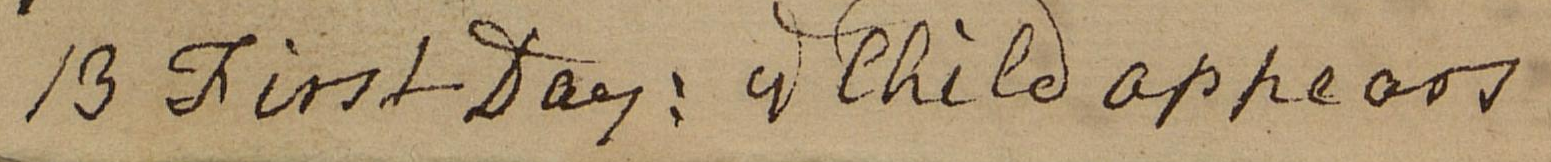13 First Day: y^e Child appears
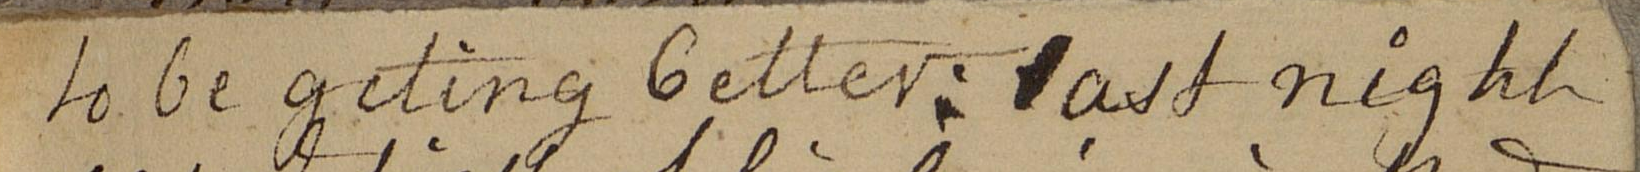to be geting better; last night
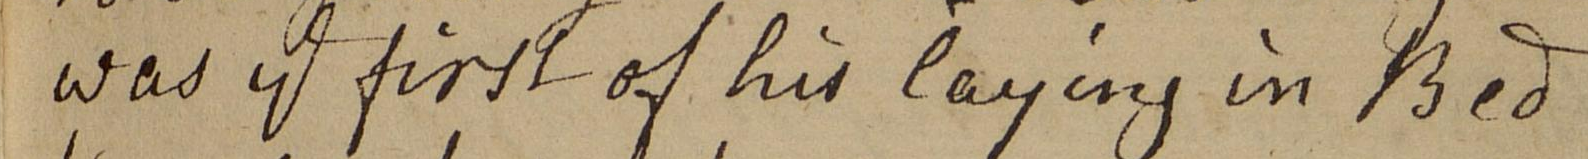was y^e first of his laying in Bed
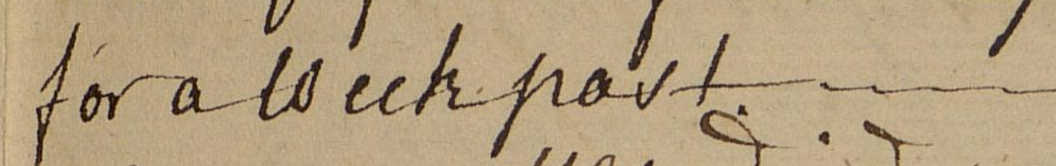for a week past-
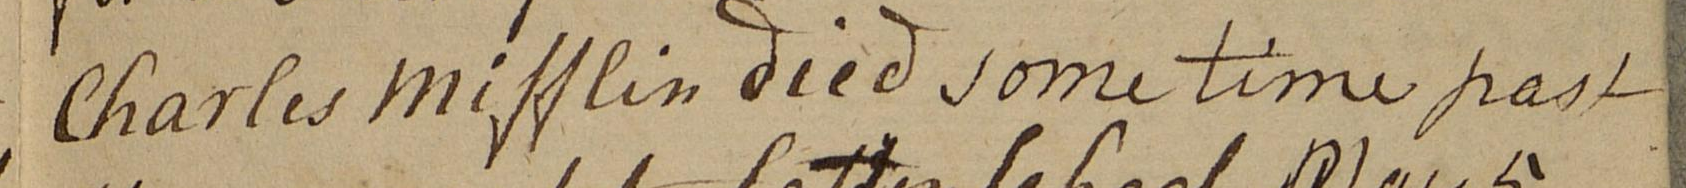Charles Mifflin died some time past
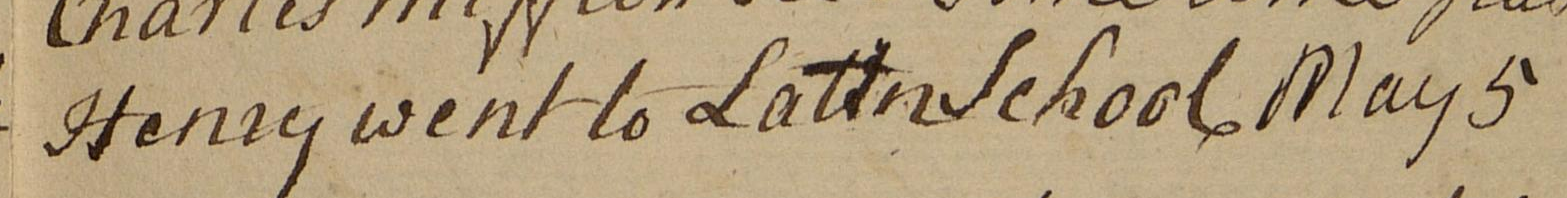Henry went to Latin School May 5
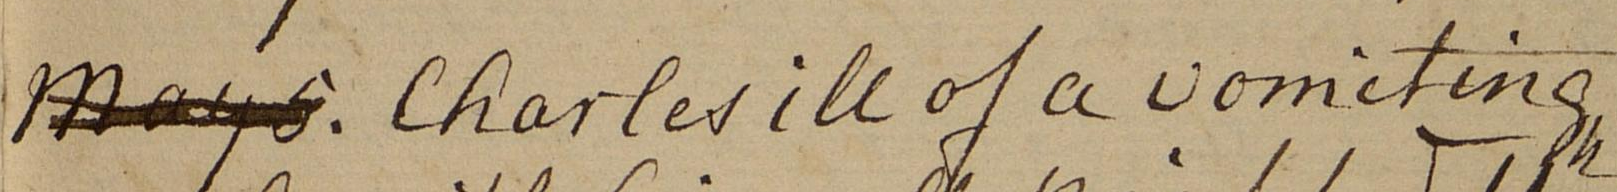[May 5] Charles ill of a vomiting
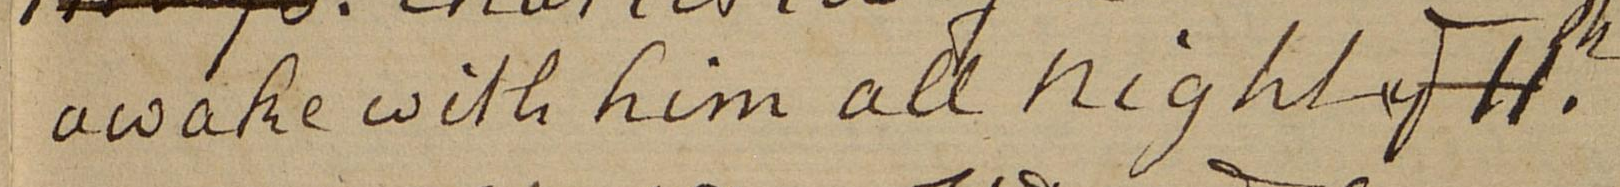awake with him all night y^e H^h.
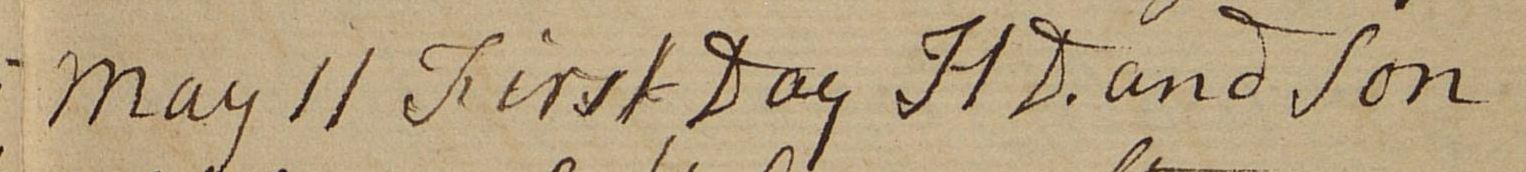May 11 First Day HD. and Son
